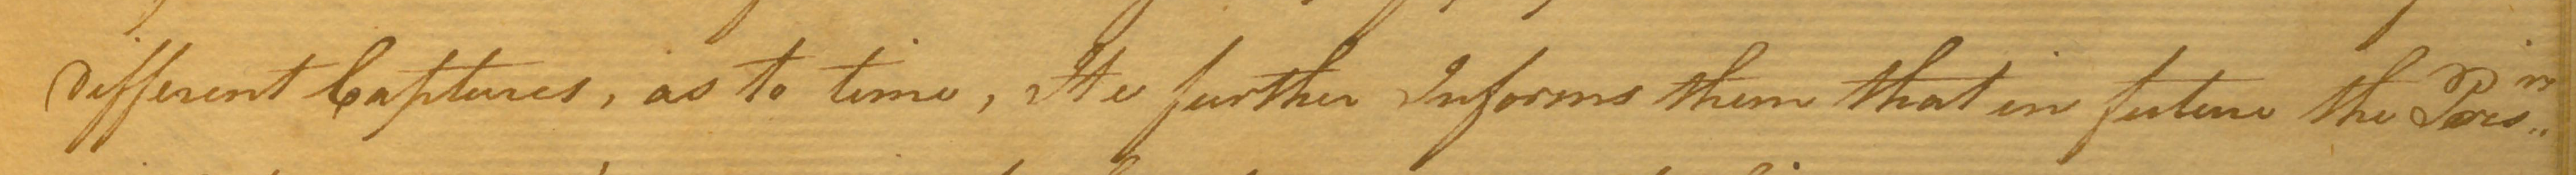different Captains, as to time, He further informs them that in future the Pris^rs.
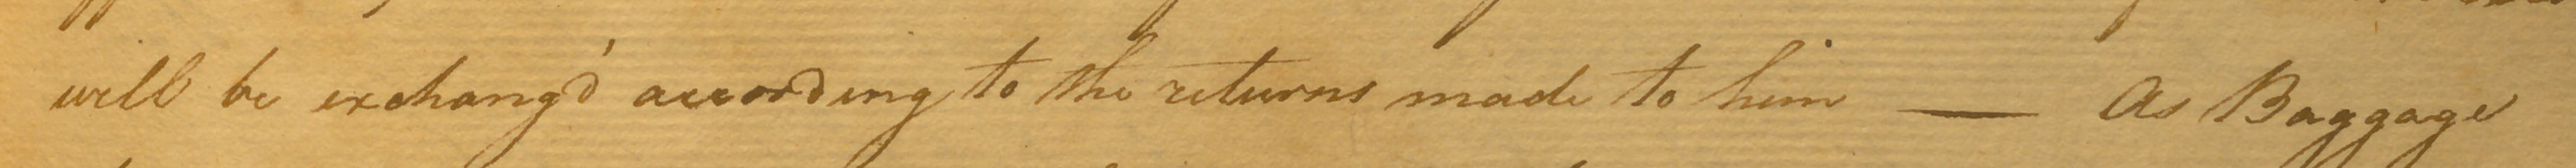will be exchang'd according to the returns made to him- A Baggage
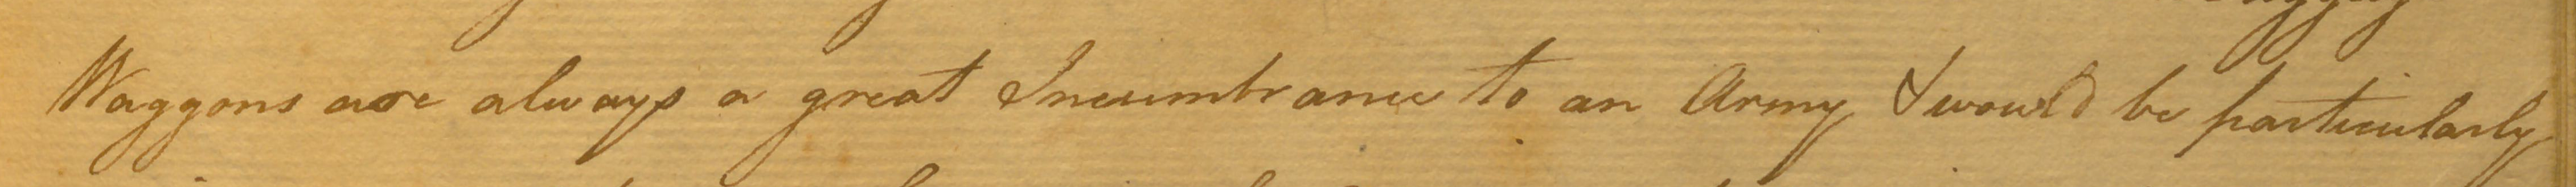Waggons are always a great Incumbrance to an Army & would be particularly
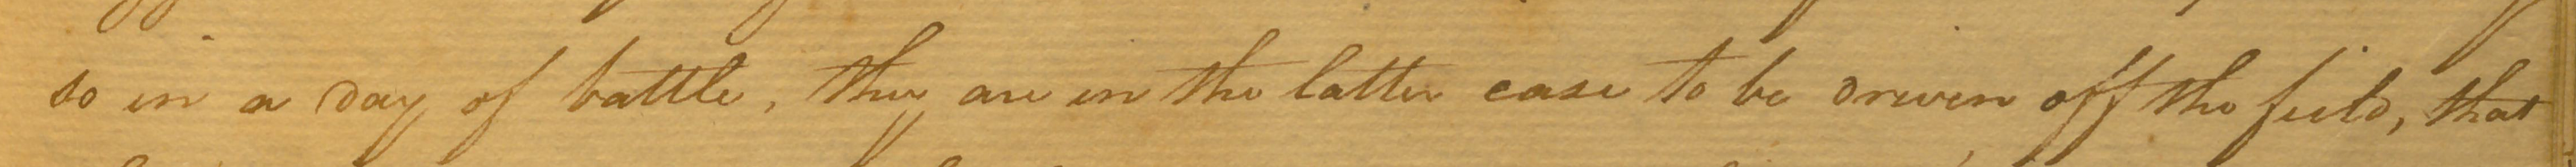so in a day of battle, they are in the latter case to be driven off the field, that
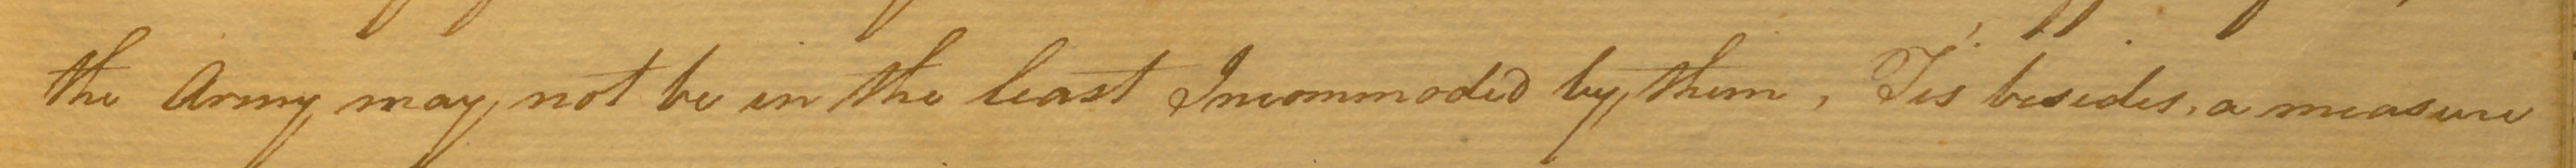the Army may not be in the least Incommoded by them, Tis besides a measure
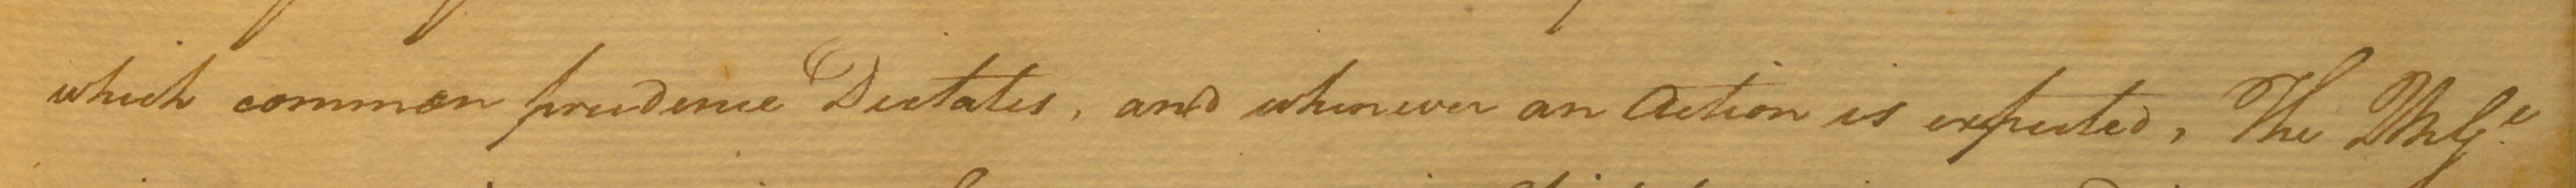which common prudence Dictates, and wherever an Action is expected. The QMG^l.
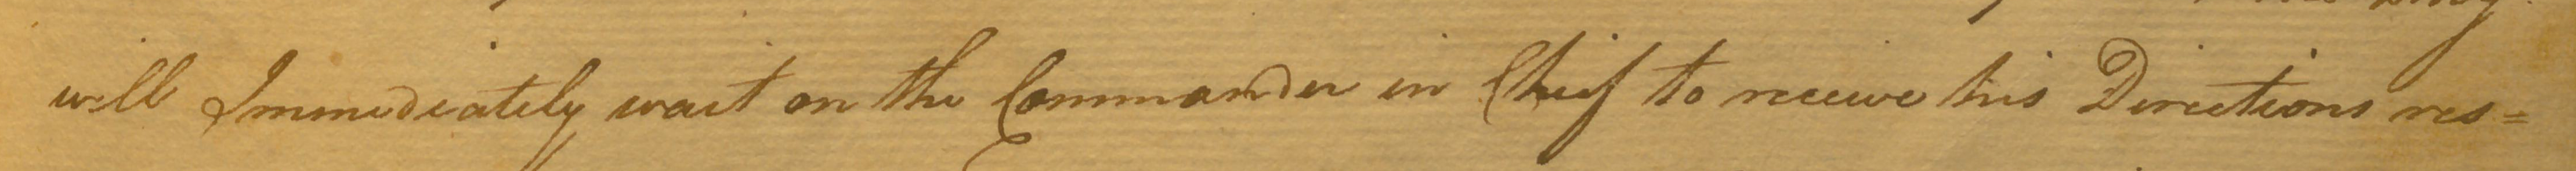will Immediately wait on the Commander in Chief to receive his Directions res-
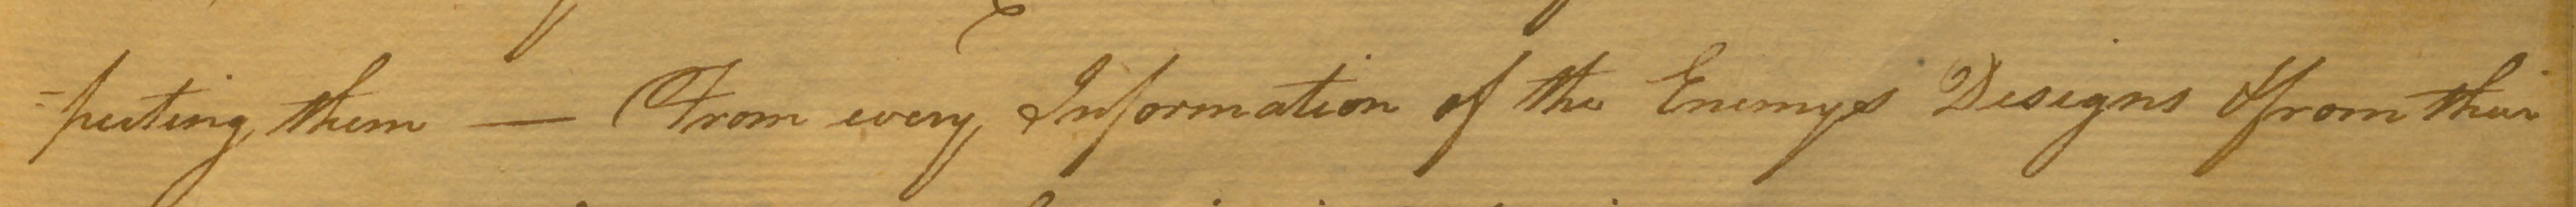-pecting them- From every Information of the Enemy's Designs & from their
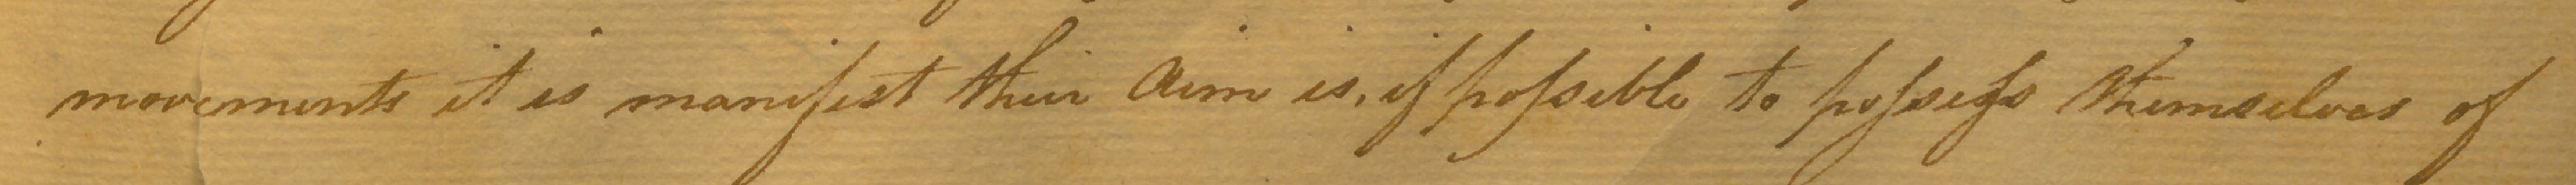movements it is manifest their Aim is, if possible to possess themselves of
